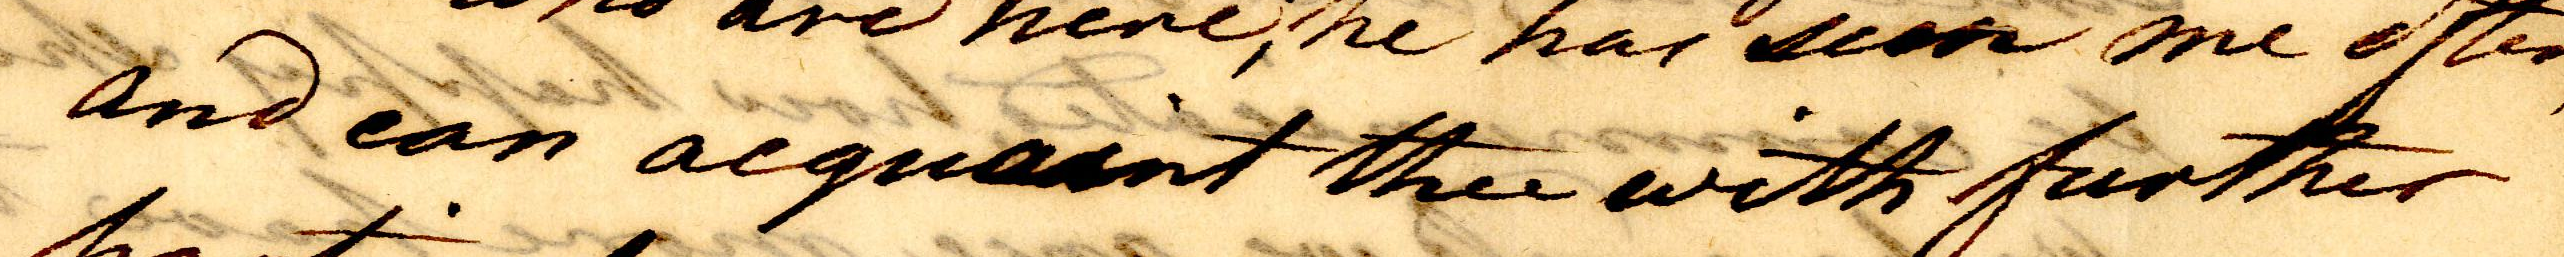and can acquaint thee with further
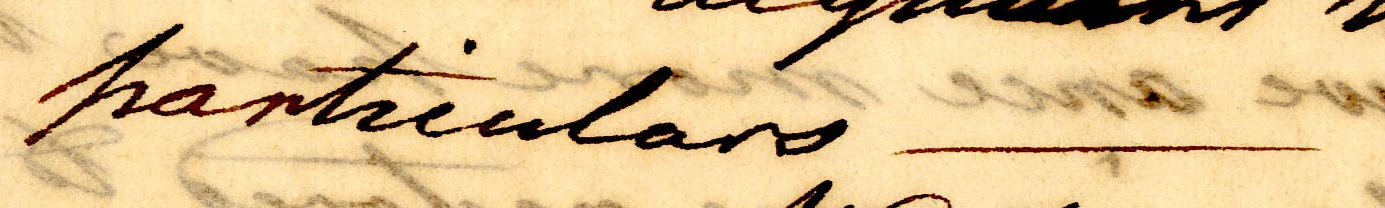particulars-
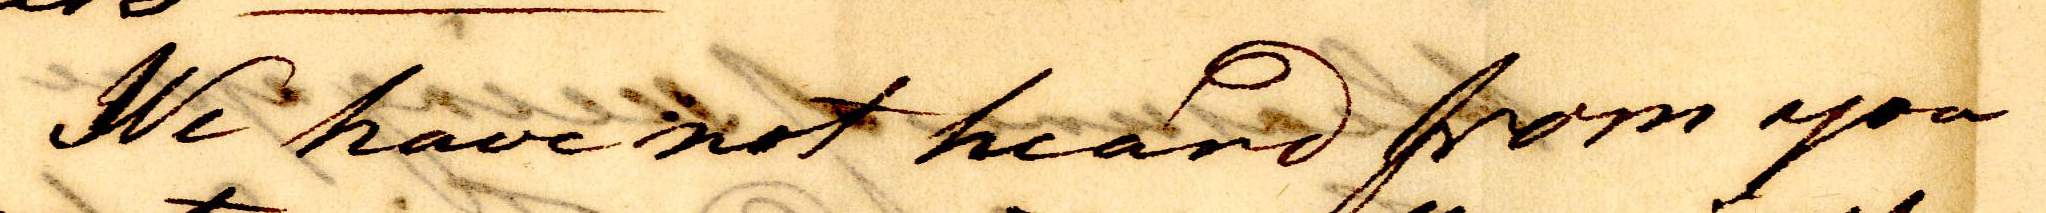We have not heard from you
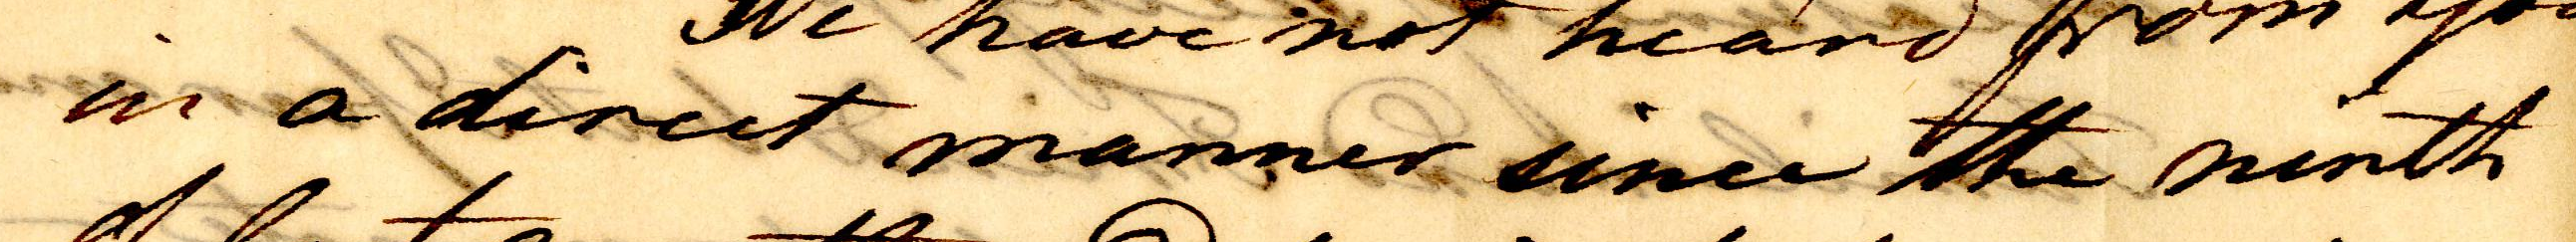in a direct manner since the ninth
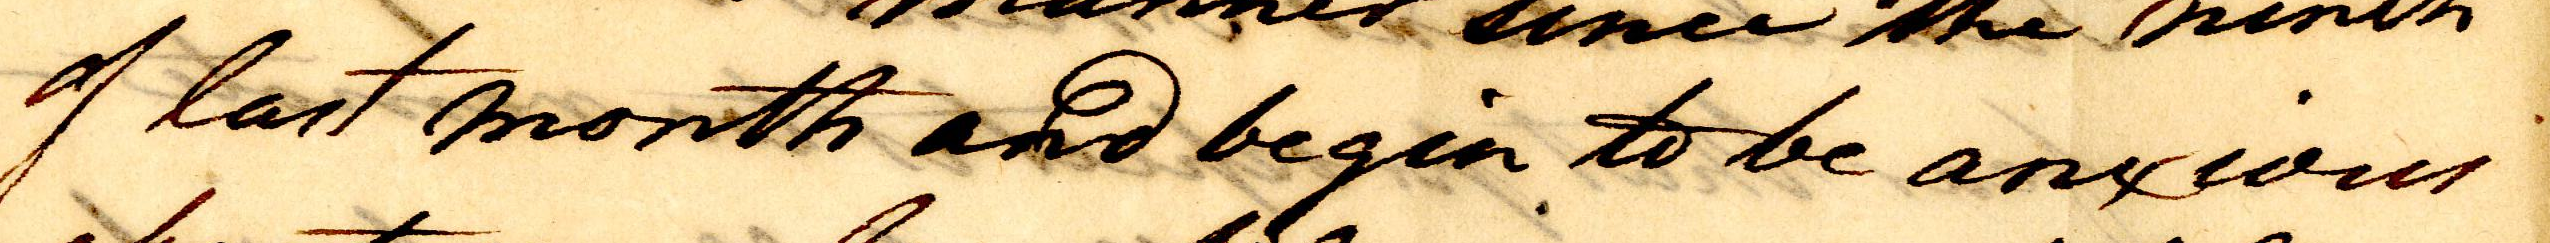of last month and begin to be anxious
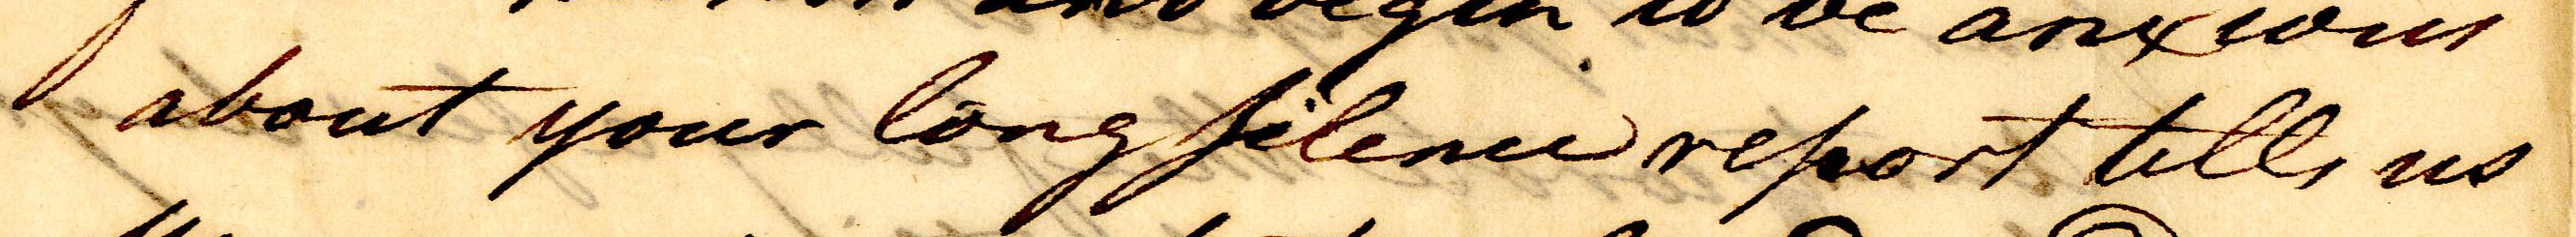about your long silence report tells us
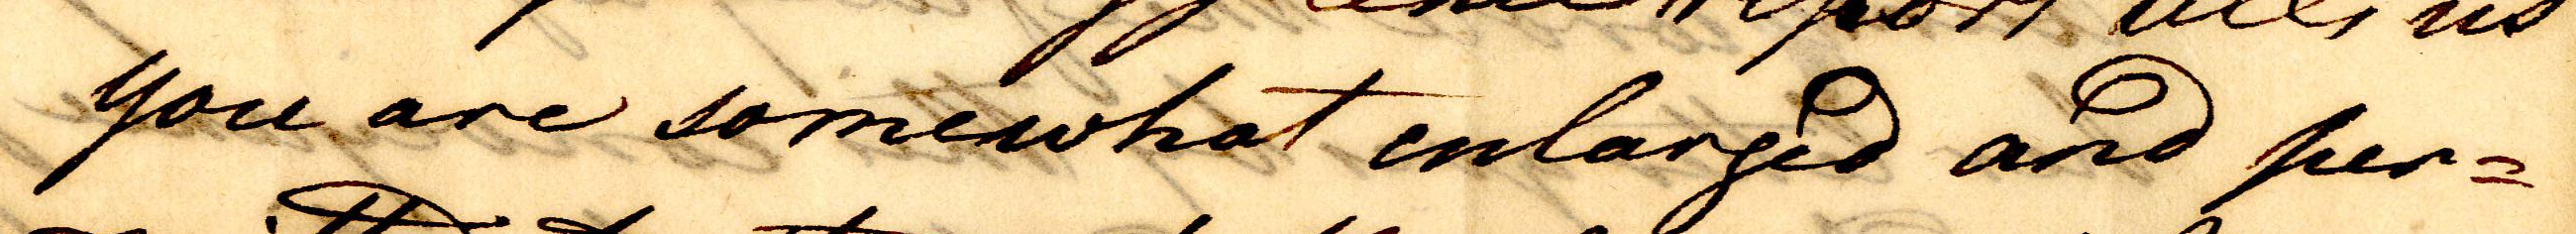you are somewhat enlarged and per-
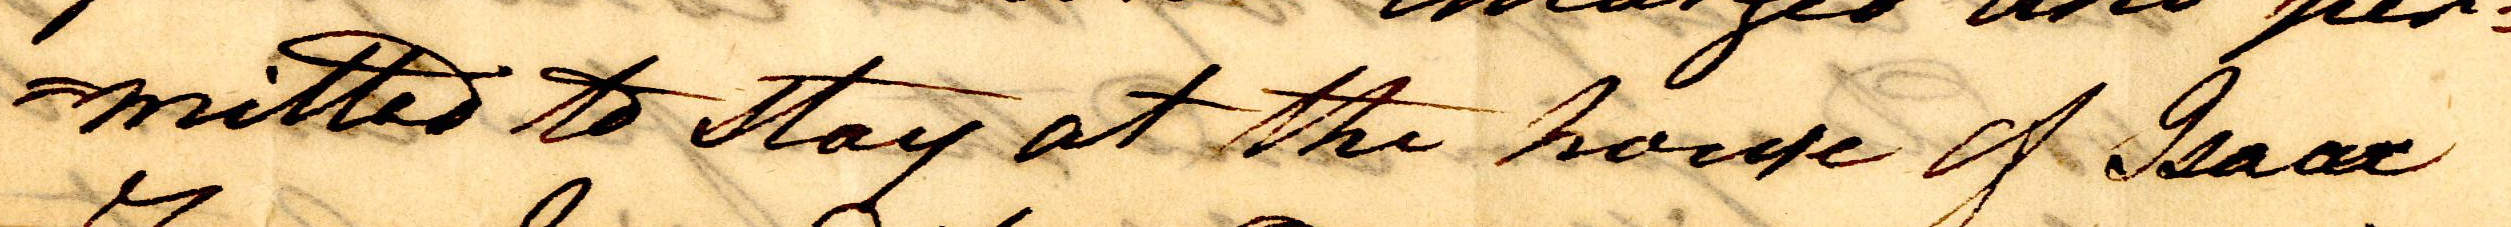-mitted to stay at the house of Isaac
